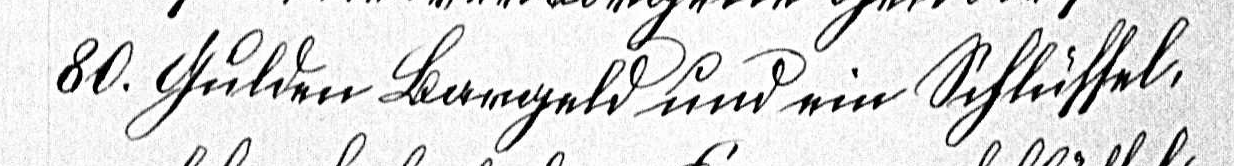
80 Gulden Bargeld und ein Schlüssel,
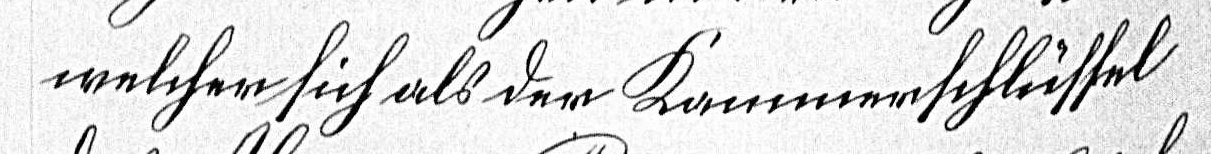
welcher sich als der Kammerschlüssel
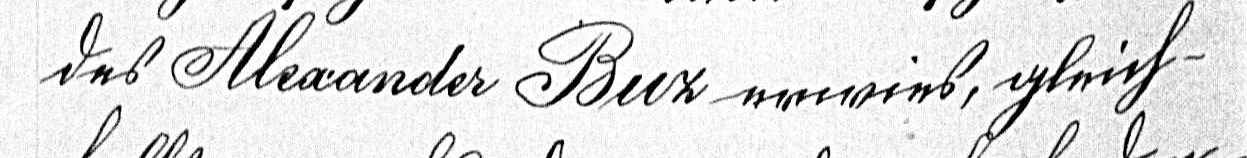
des Alexander Buz erwies, gleich¬
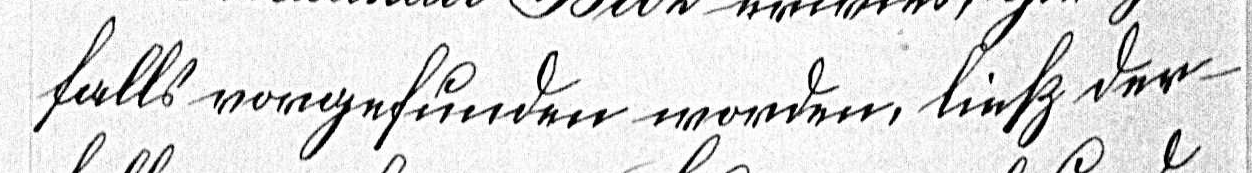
falls vorgefunden worden, ließ der¬
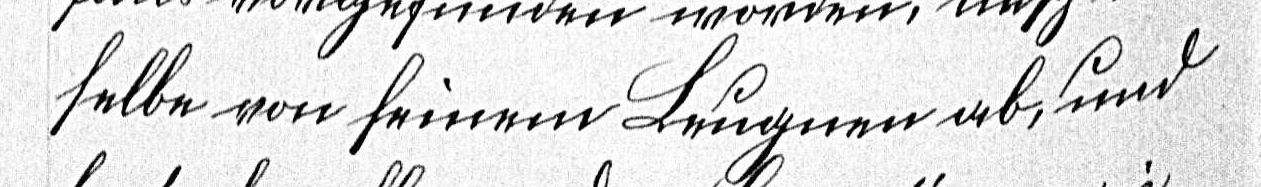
selbe von seiner Leugnen ab, und
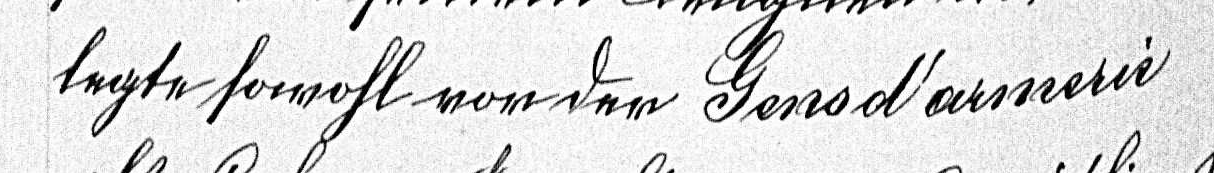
legte sowohl vor der Gens d’armerie
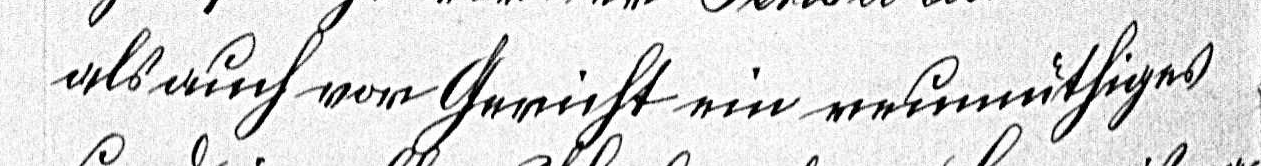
als auch vor Gericht ein reumüthiges
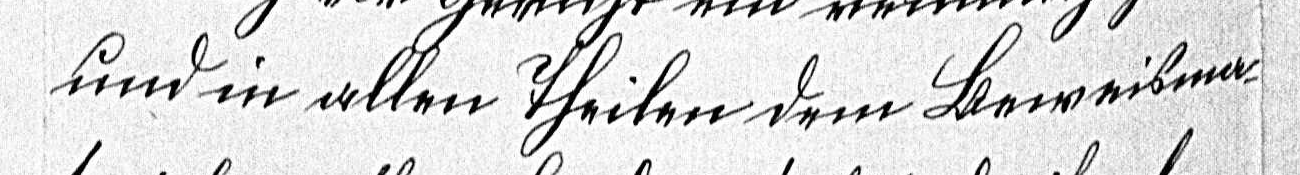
und in allen Theilen dem Beweisma¬
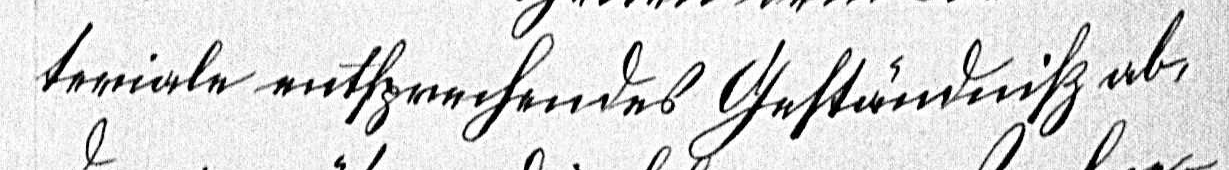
teriale entsprechendes Geständniß ab,
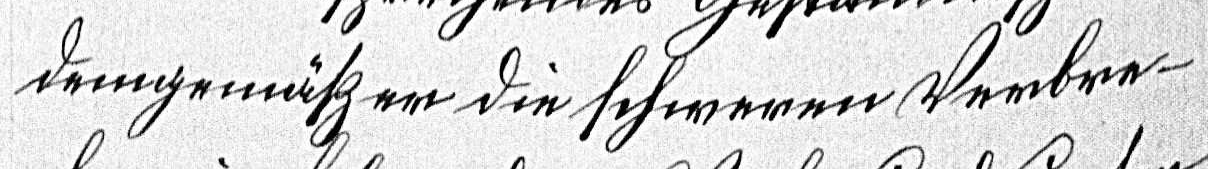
demgemäß er die schweren Verbre¬
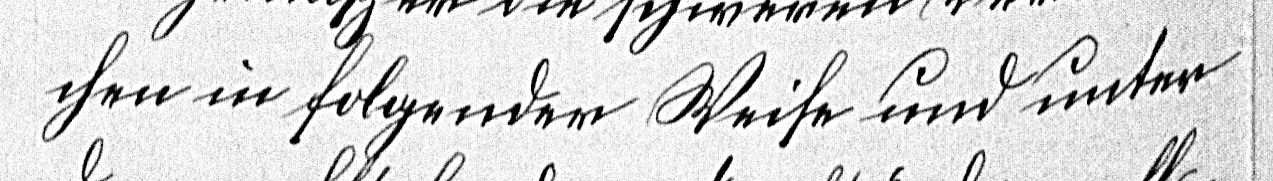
chen in folgender Weise und unter
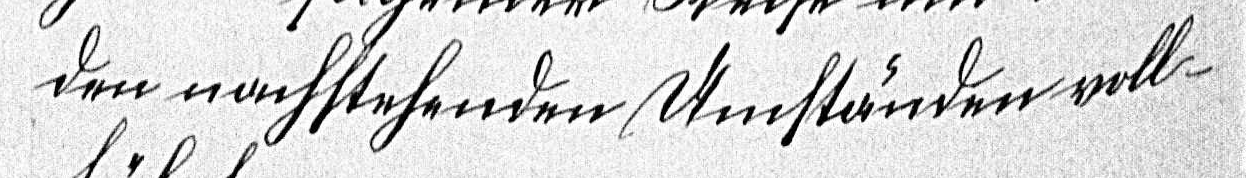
den nachstehenden Umständen voll¬
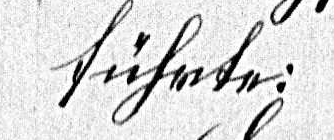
führte:
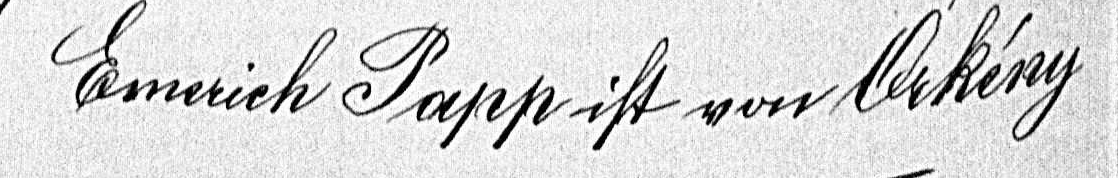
Emerich Papp ist von Orkény
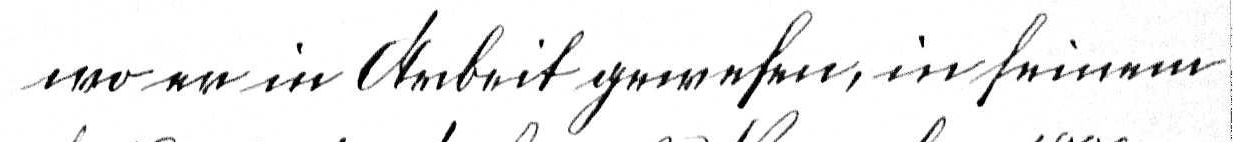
wo er in Arbeit gewesen, in seinem
